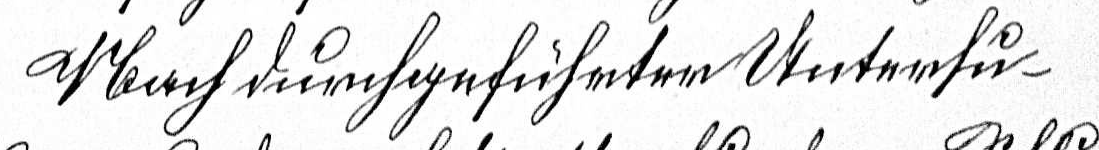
Nach durchgeführter Untersu¬
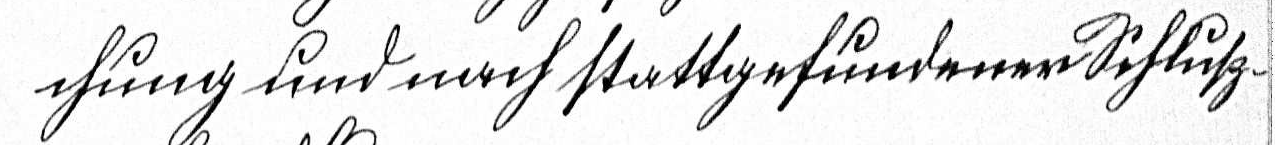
chung und nach stattgefundener Schluß¬
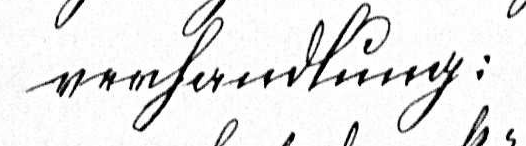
verhandlung:
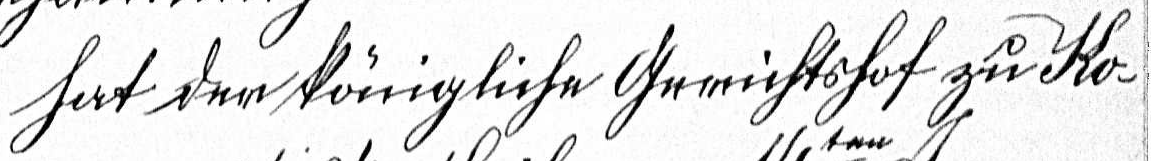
Hat der königliche Gerichtshof zu Ko¬
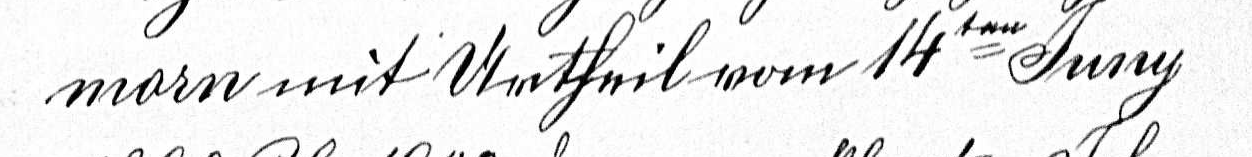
morn mit Urtheil vom 14ten Juny
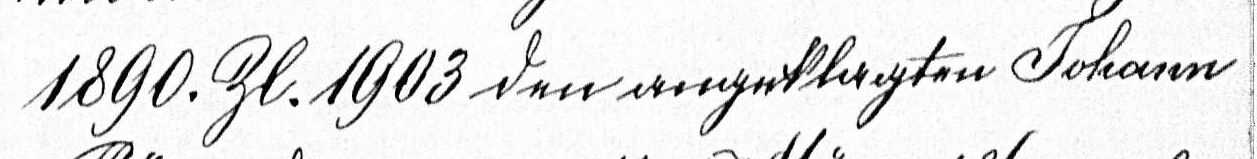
1890. Zl. 1903 den angeklagten Johann
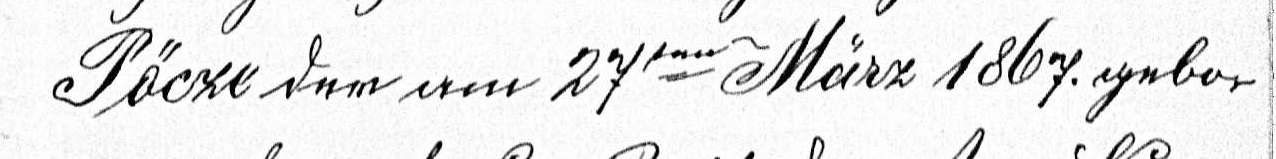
Pöcze der am 27ten März 1867 gebo¬
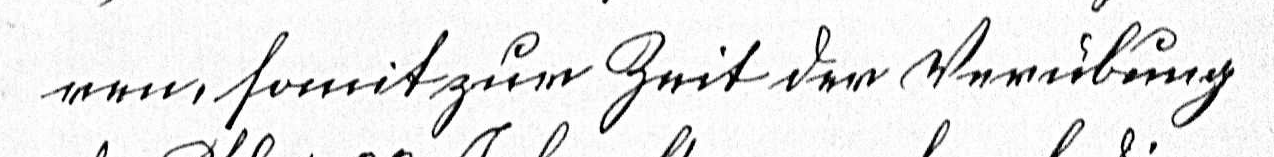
ren, somit zur Zeit der Verübung
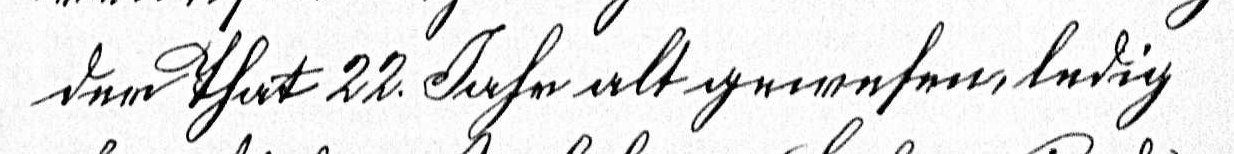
der That 22. Jahr alt gewesen, ledig
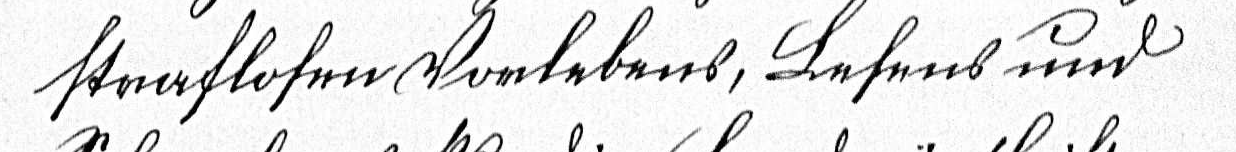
straflosen Vorlebens, Lesens und
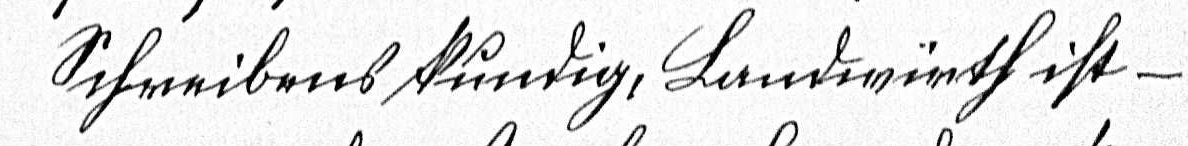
Schreibens kundig, landwirth ist –
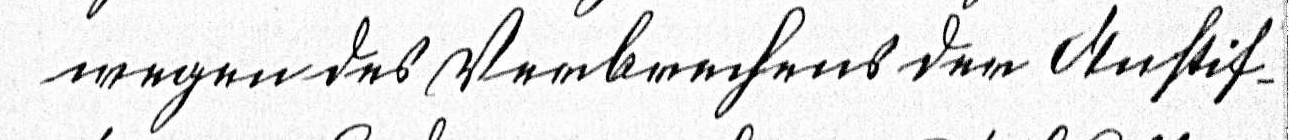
wegen des Verbrechens der Anstif¬
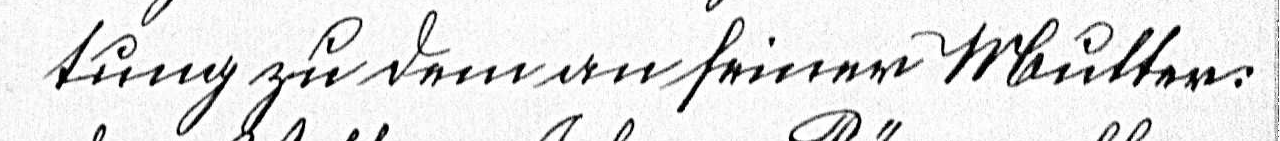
tung zu dem an seiner Mutter
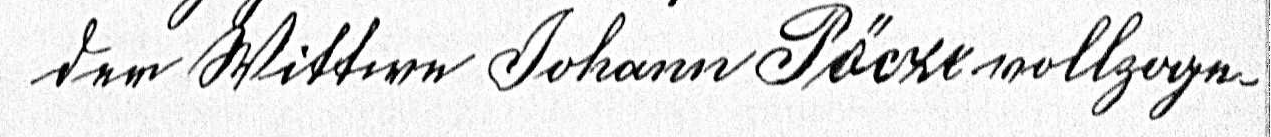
der Wittwe Johann Pöcze vollzoge¬
